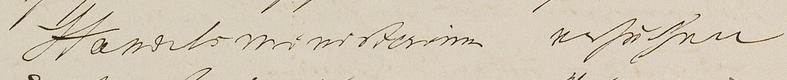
Handelsministerium ersuchen
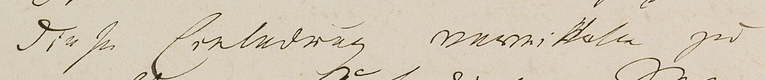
diese Einladung vermitteln zu
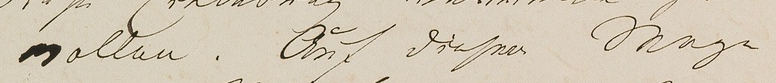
wollen. Auf diesem Wege
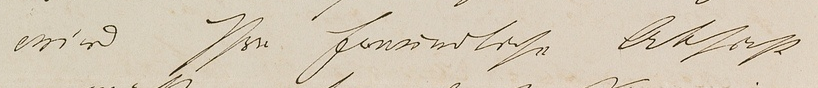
wird Ihre freundliche Absicht
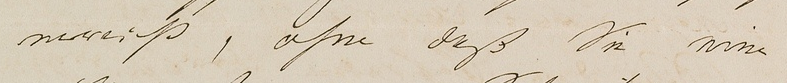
erreicht, ohne daß Sie eine
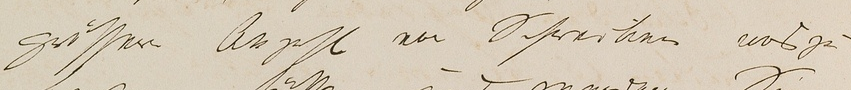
grössere Anzahl an Schreiben auszu-
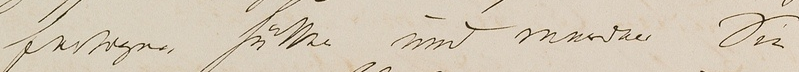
fertigen hätten und werden Sie
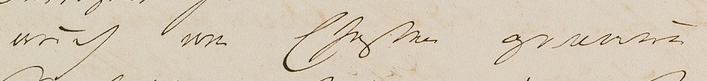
auch am Ehesten genaue
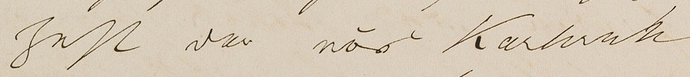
Zahl der aus Karlsruhe
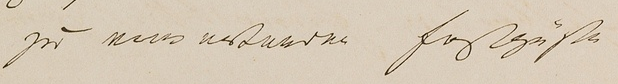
zu erwartenden Festgäste sein
